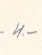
-4.-
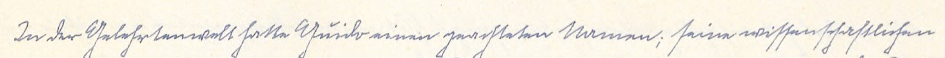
In der Gelehrtenwelt hatte Guido einen geehrten Namen; seine wissenschaftlichen
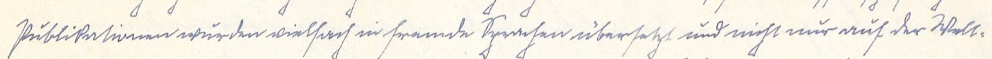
Publikationen wurden vielfach in fremde Sprachen übersetzt und nicht nur auf der Welt-
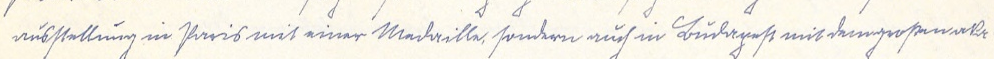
ausstellung in Paris mit einer Medaille, sondern auch in Budapest mit dem großen aka-
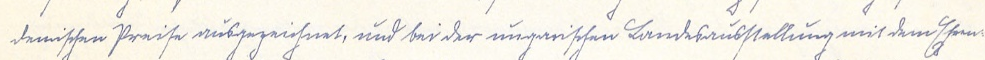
demischen Preise ausgezeichnet, und bei der ungarischen Landesausstellung mit dem Ehren-
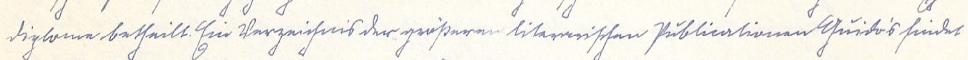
diplom betheilt. Ein Verzeichnis der größeren literarischen Publicationen Guido's findet
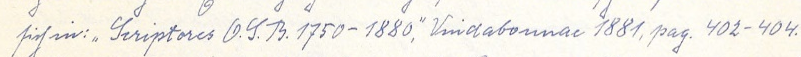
sich in: "Scriptores O. S. B. 1750-1880," Vindabonae 1881, pag. 402-404.
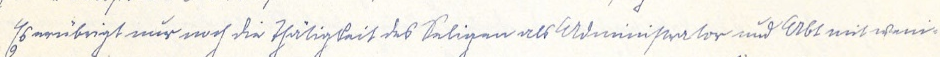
Es erübrigt nur noch die Thätigkeit des Seligen als Administrator und Abt mit weni-
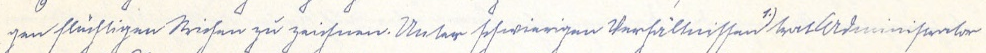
gen flüchtigen Strichen zu zeichnen. Unter schwierigen Verhältnissen1.) trat Administrator
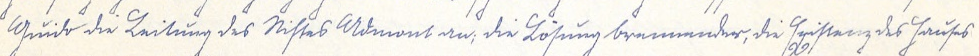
Guido die Leitung des Stiftes Admont an; die Lösung brennender, die Existenz des Hauses
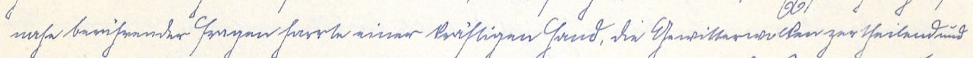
nahe berührender Fragen harrte einer kräftigen Hand, die Gewitterwolken zertheilend und
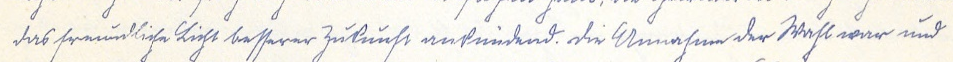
das freundliche Licht besserer Zukunft ankündend. Die Annahme der Wahl war und
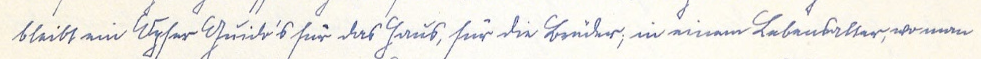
bleibt ein Opfer Guido's für das Haus, für die Brüder; in einem Lebensalter, wo man
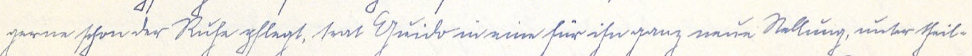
gerne schon der Ruhe pflegt, trat Guido in eine für ihn ganz neue Stellung, unter theil-
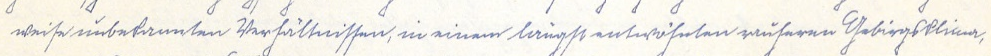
weise unbekannten Verhältnissen, in einem längst entwöhnten rauheren Gebirgsklxxx,
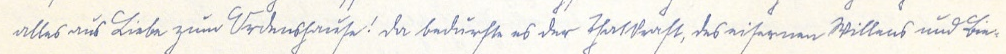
alles aus Liebe zum Ordenshause! Da bedurfte es der Thatkraft, des eisernen Willens und Bie-
